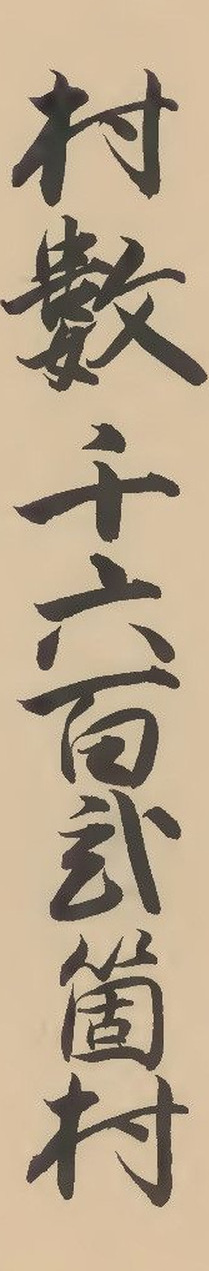村数千六百弐箇村
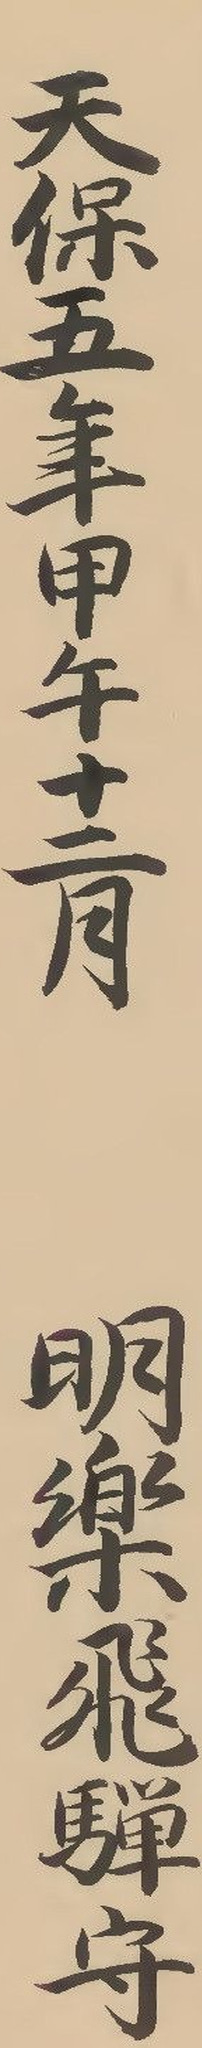天保五年甲午十二月明楽飛騨守
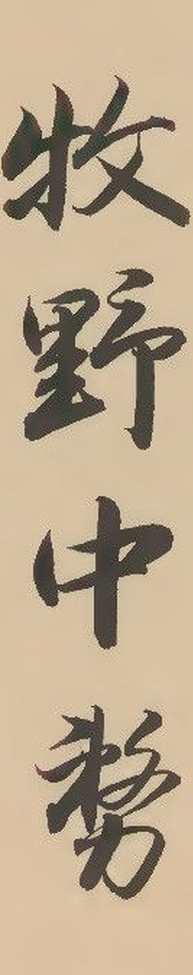牧野中務
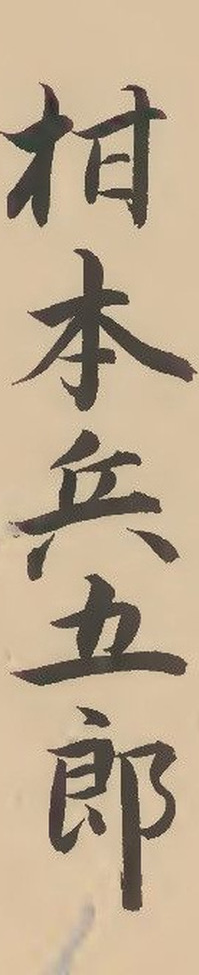柑本兵五郎
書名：美濃国郷帳
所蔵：国立公文書館 National Archives of Japan
